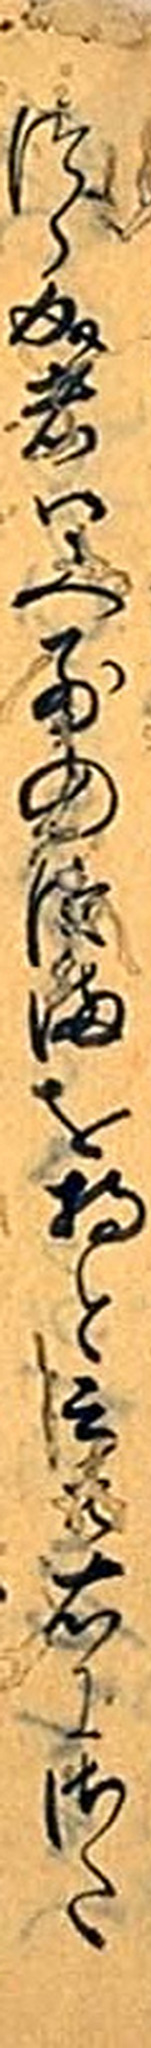つら成者は又別のつまを持と云共右にさた
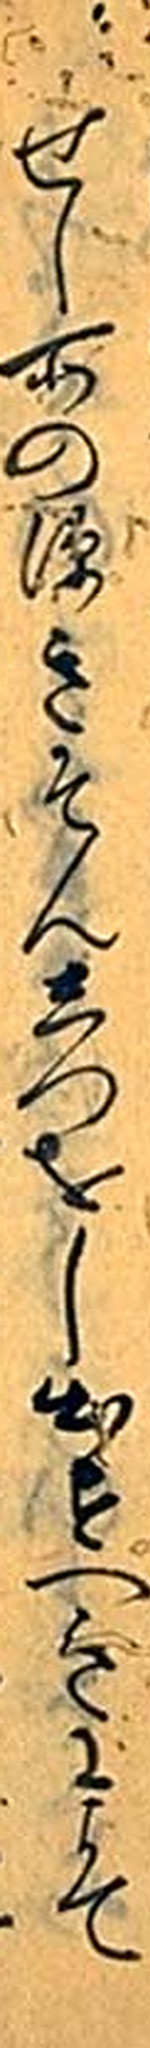せし所の深きそんしつをし出すへきによて
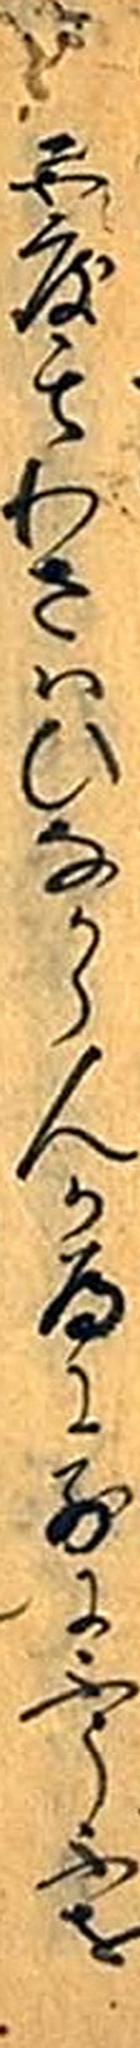二度其わさはひなからんか為に別にふうふを
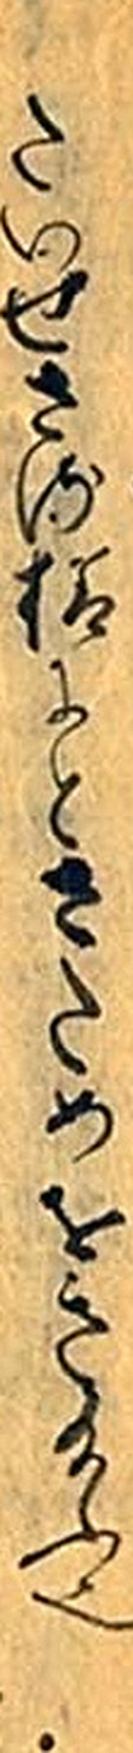たいせさる様にとさためをき給ふ也
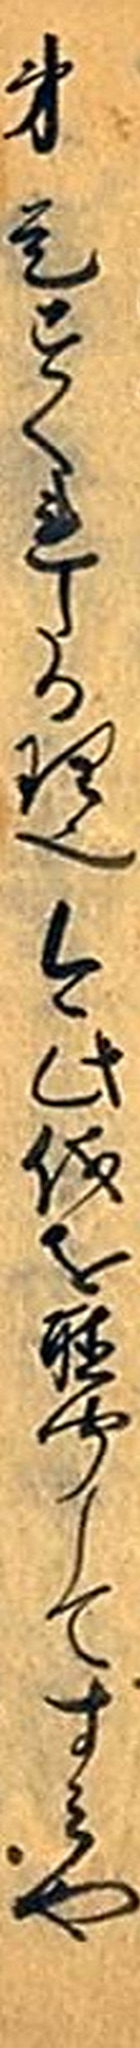弟是すくれたる理也今此儀を聴聞してすみや
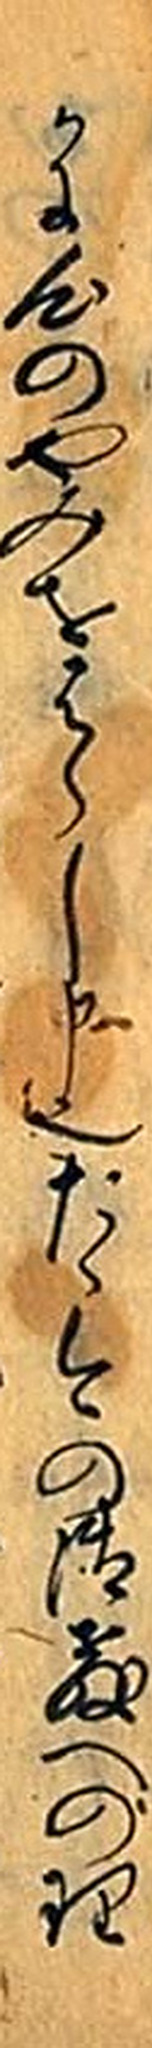かに心のやみをはらし申也たゝ今の御教への理
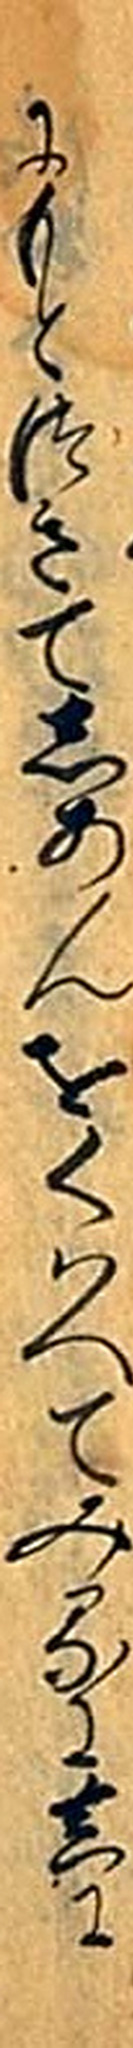にもとつきてしあんをくはへてみるに真に
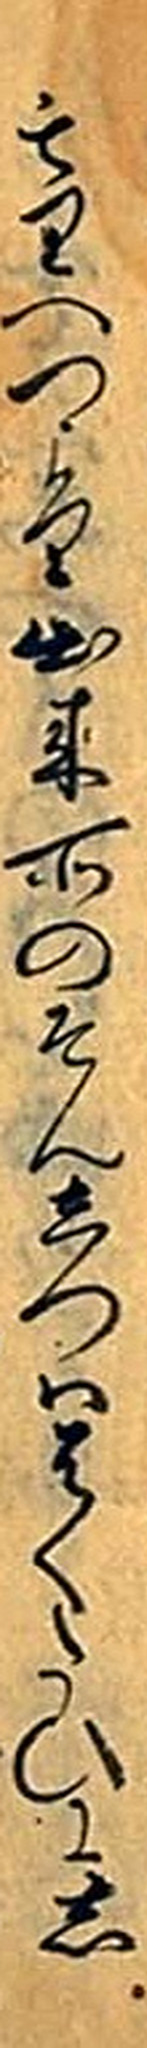其りへつより出来所のそんしつははくたひにし
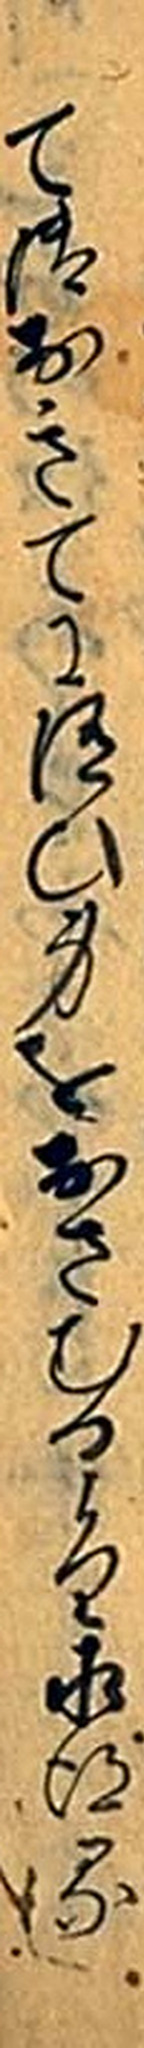て御おきてに随ひ身をおさむるより求得る
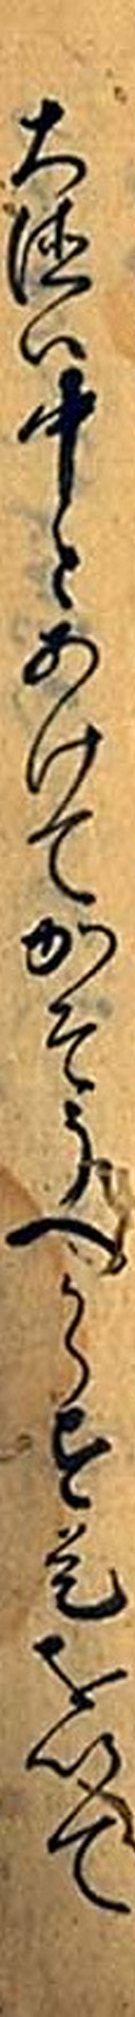大徳は中々あけてかそうへからす是を以て
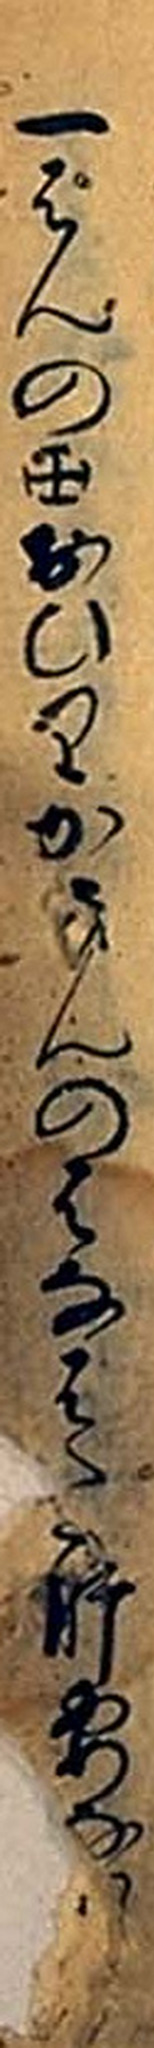一はんの☩おひりかんのはなは肝要な

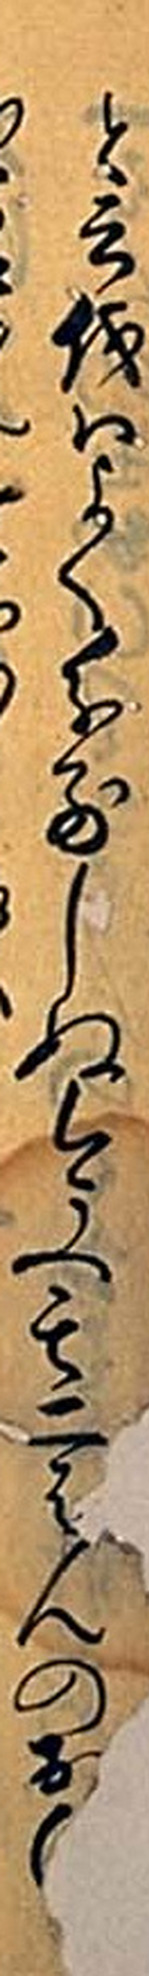と云儀はよく分別しぬ今又其二はんのお
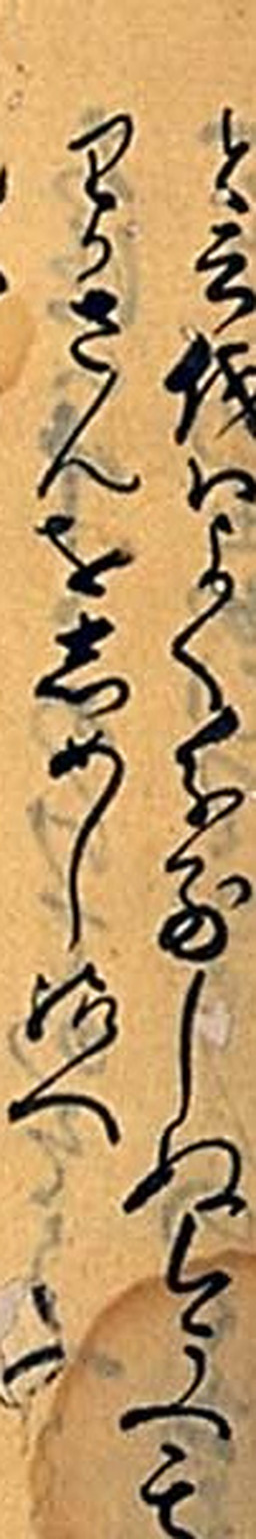りかさんをしめし給へ
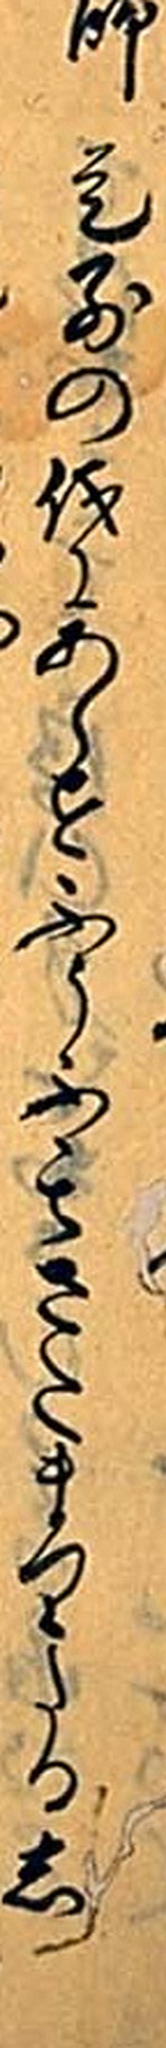師是別の儀にあらすふうふ其さたまりたるし
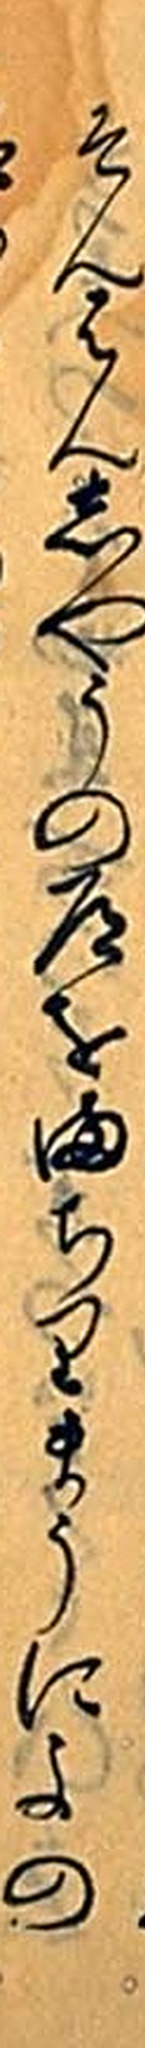そんはんしやうの道をまちりまうによの
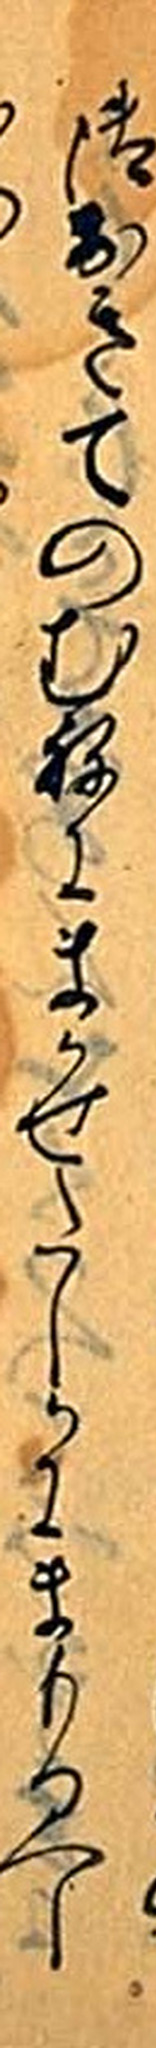御おきてのむねにまかせたしかにまもるへし
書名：ドチリナ・キリシタン
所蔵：東京大学総合図書館 / General Library in the University of Tokyo
